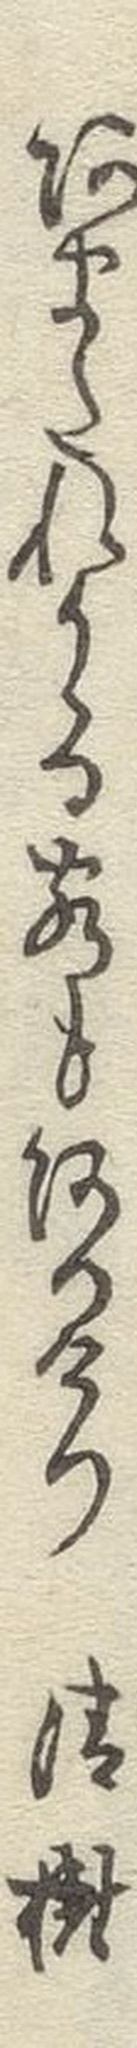あまたれりくる客もありけり良材庵
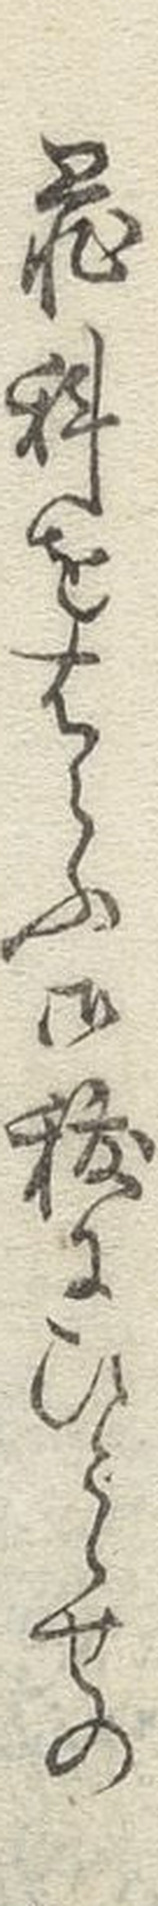罪料をはらふ御祓にひとゝせの文栄子
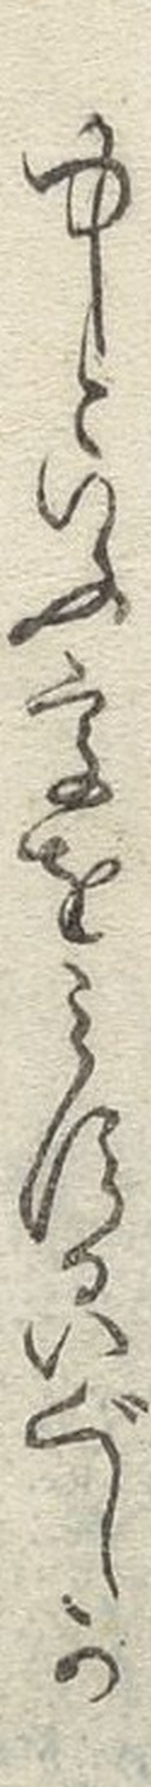中という字をみするいぐしか雪麿
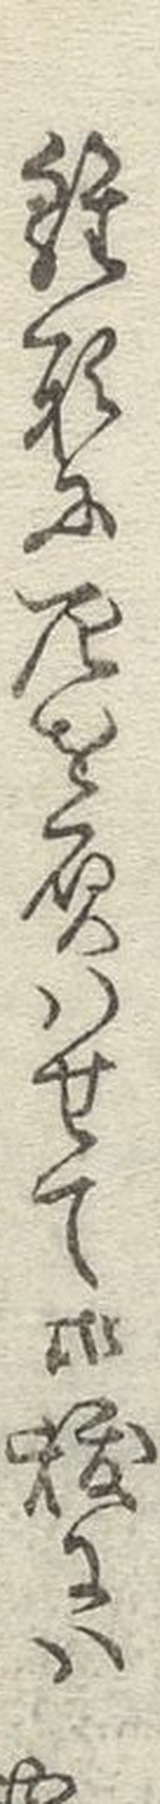雛形に厄を負はせて御祓には證真衆
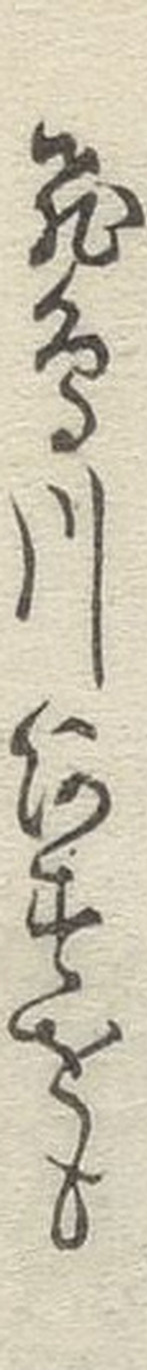飛鳥川あすをも
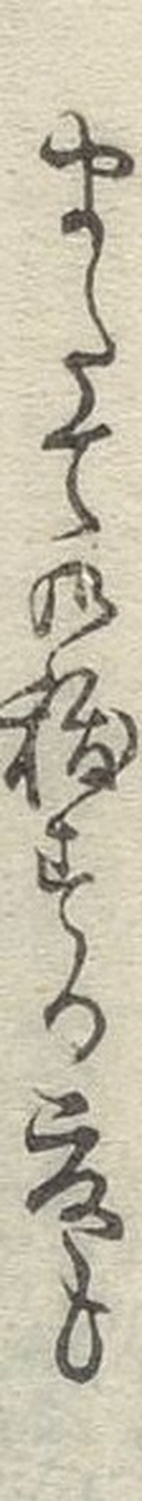またて御祓する夏も
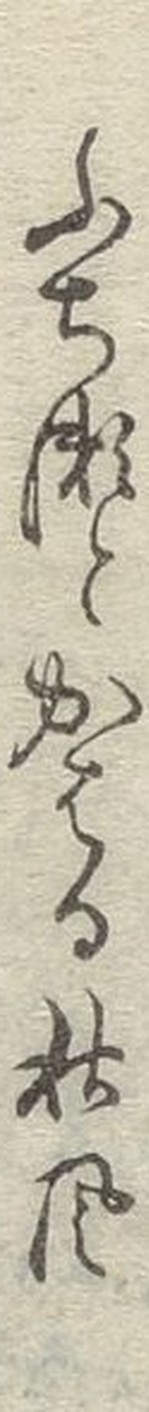ふち瀬とかはる秋風
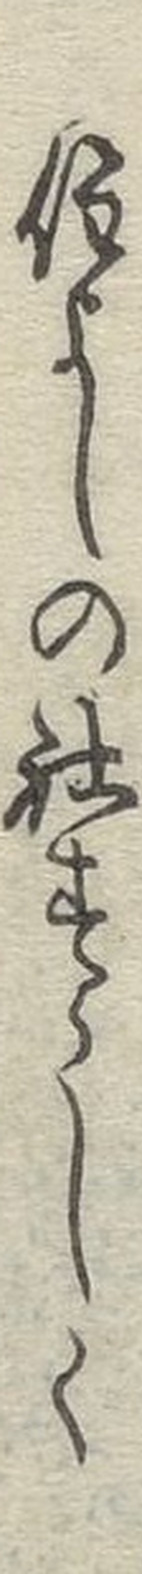住よしの社すゝしく
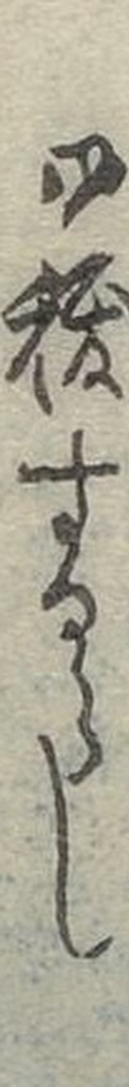御祓するらし

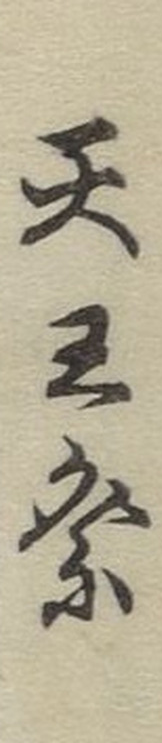天王祭
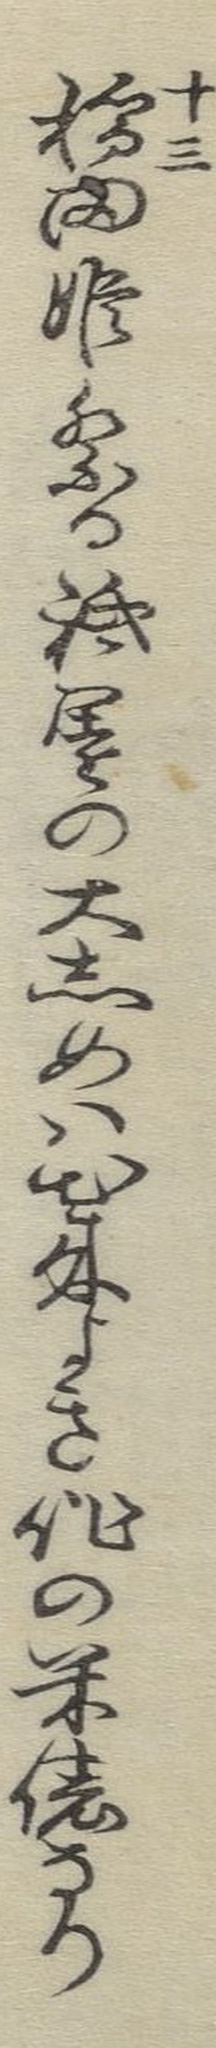稲田姫祭る祇園の大しめは出来よき作の米俵な
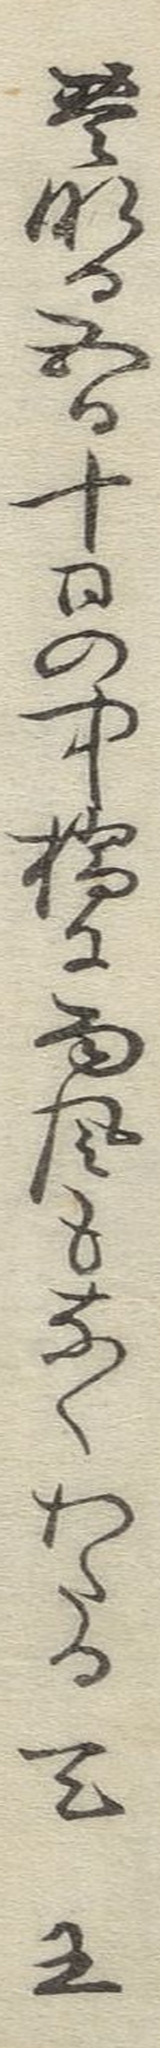豊なる五日十日の中橋に雨風もなくわたる天王
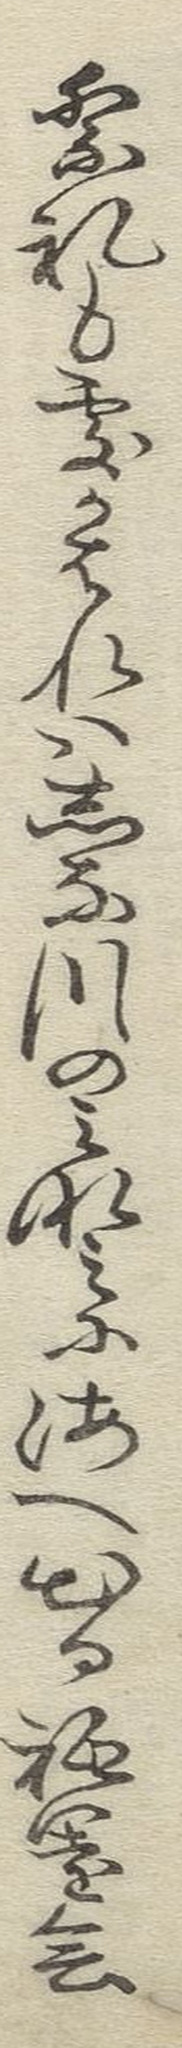祭礼も処かはれはしなか川のみなみに海へ出る
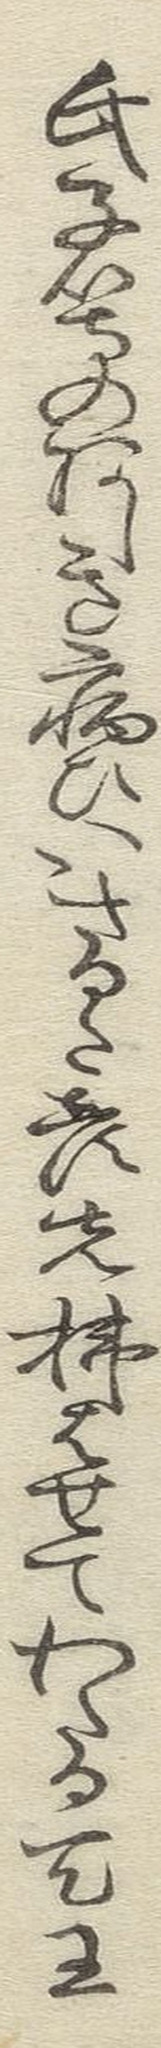氏子等のあしき病ひはさるた彦先払はせてわた
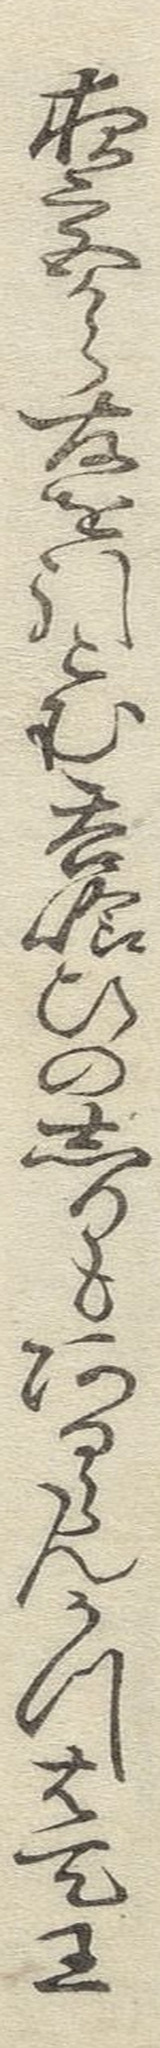夜宮から友を引こむ呑喰ひのしりもあるらんか
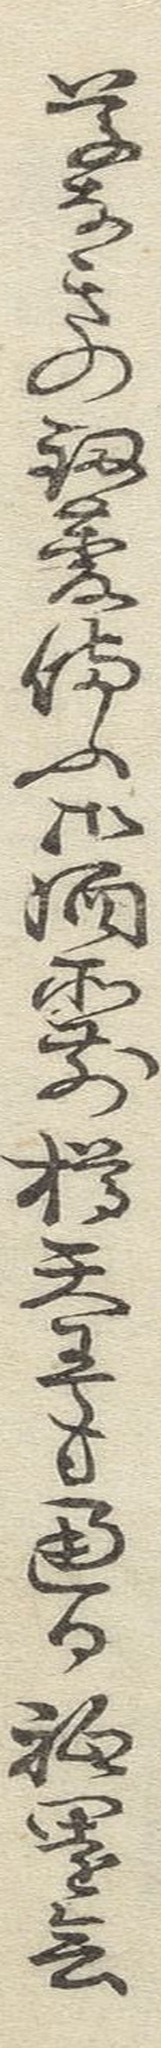草なきの釼蔓備ふ御酒所前樽天王も通祇園会
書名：Picture Album of People with Kyōka (Light Verse) (Kyōka shiki jinbutsu 狂歌四季人物)
